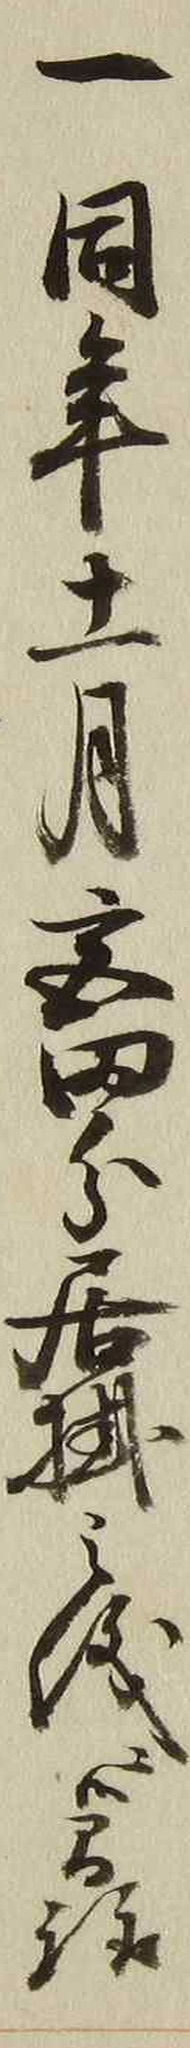一同年十一月宮田分居掛之儀ニ候間諏
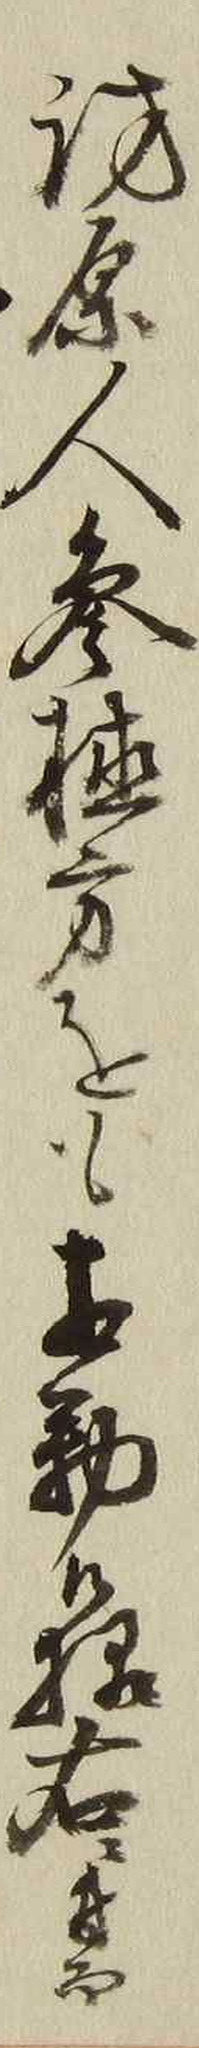訪原人参植方をも相勤候様右ニ付而
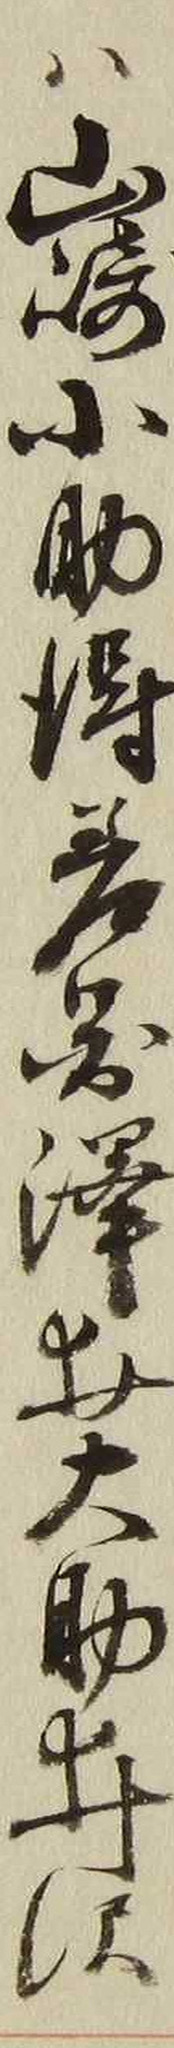ハ山崎小助白得差図沢井大助井沢
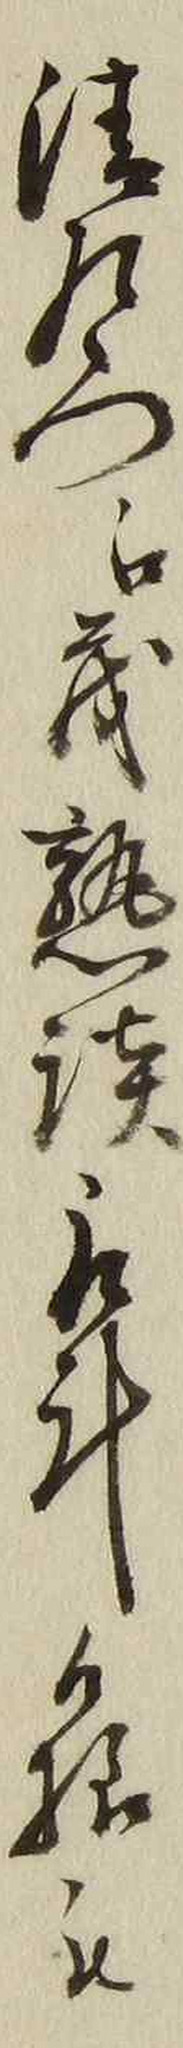清左衛門江茂熟談取計候様被
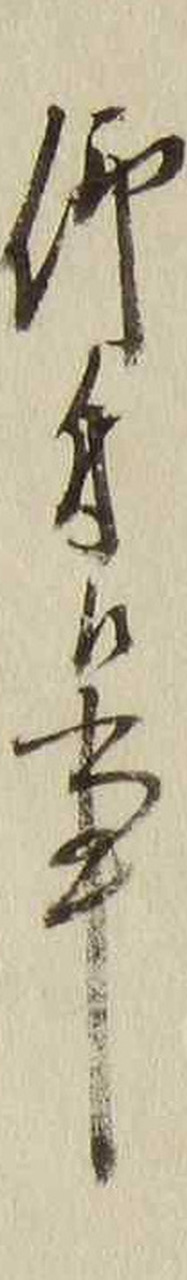仰付候事
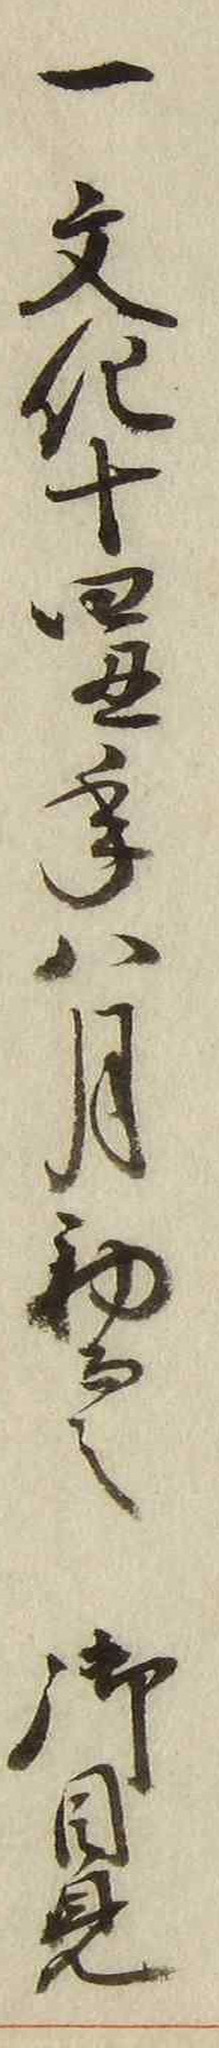一文化十四丑年八月初而之御目見

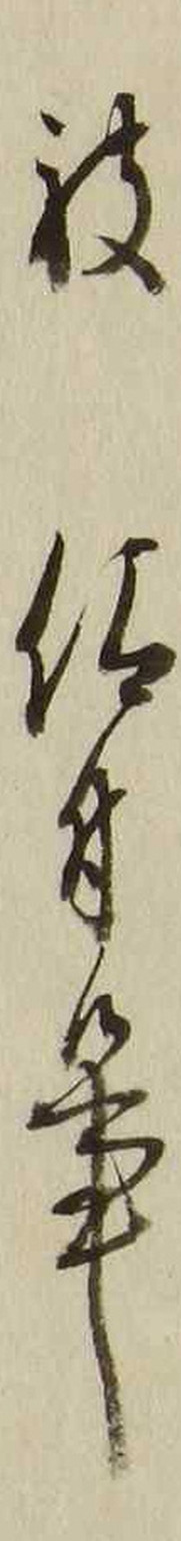被仰付候事
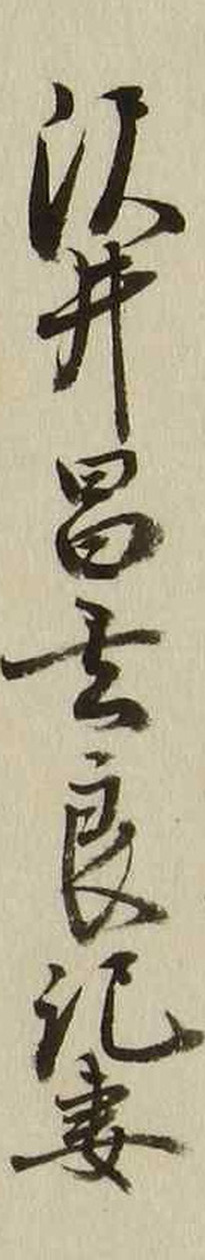沢井昌玄良記妻
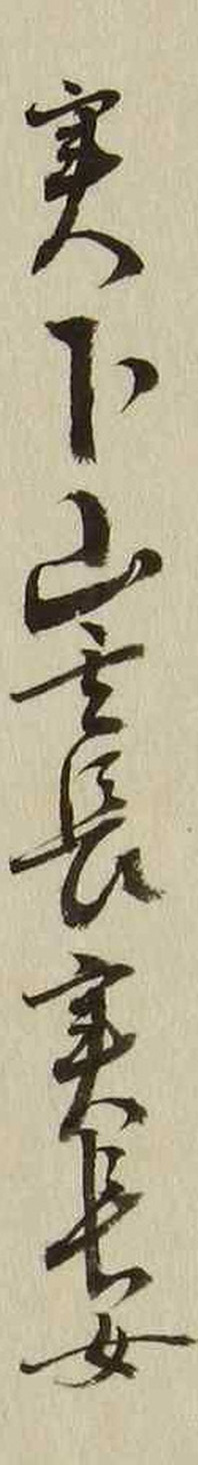実下山玄長実長女
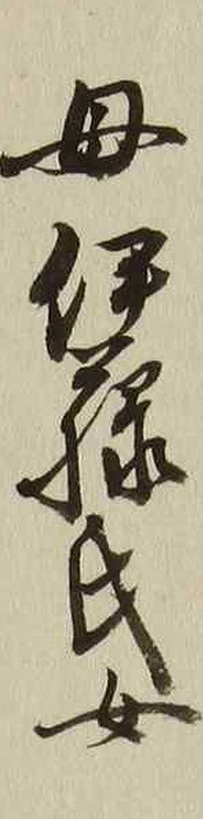母伊予氏女
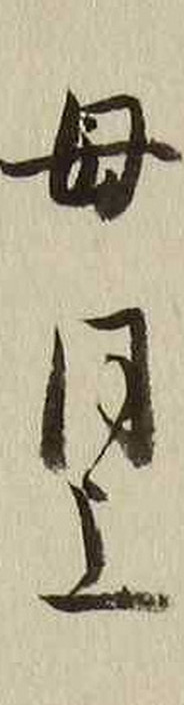母同上
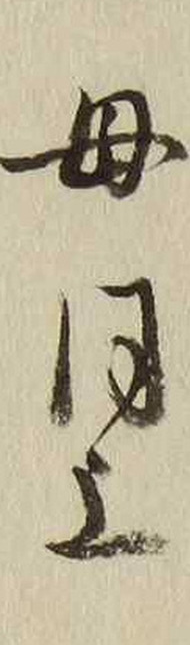母同上
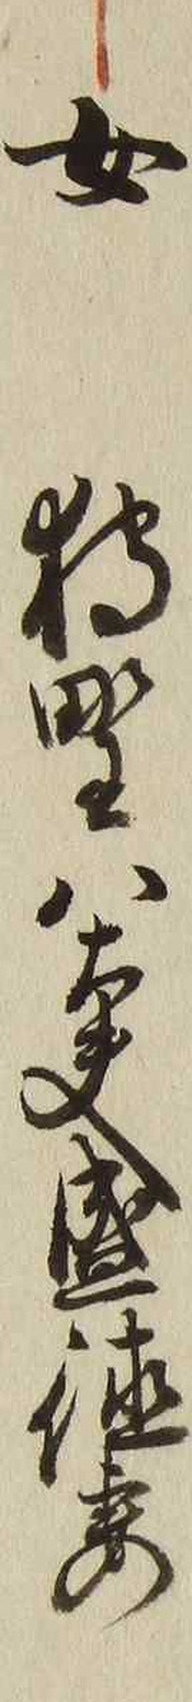女狩野八大夫盛徳妻
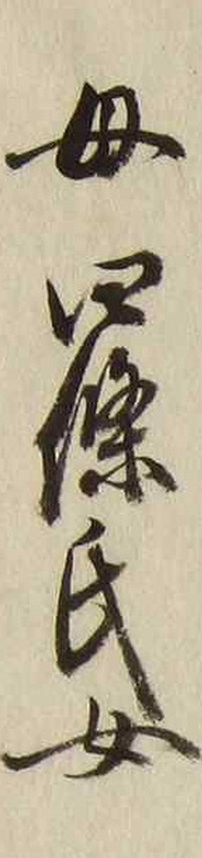母四条氏女

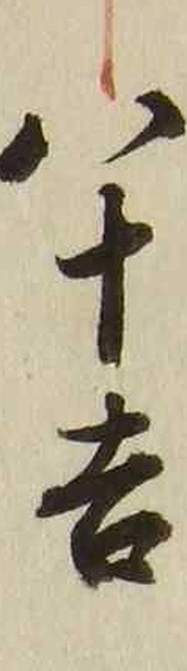八十吉
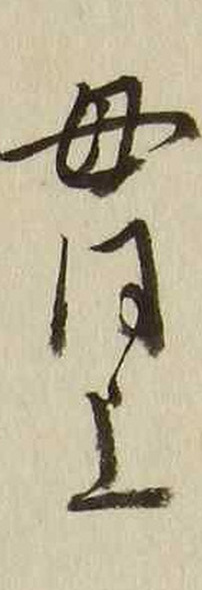母同上
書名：諸士系譜　巻之27　い之部27
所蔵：会津若松市立会津図書館
